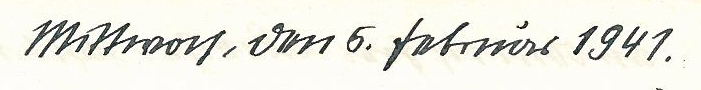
Mittwoch, den 5. Februar 1941.
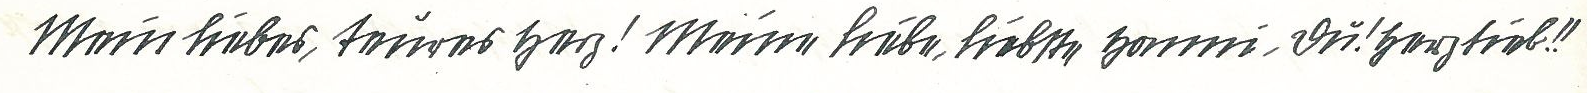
Mein liebes, teures Herz! Meine liebe, liebste, Du! Herzlieb!!
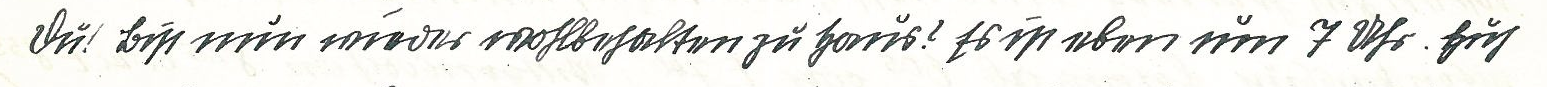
Du! Bist nun wieder wohlbehalten zu Haus? Es ist eben 7 Uhr. Huh
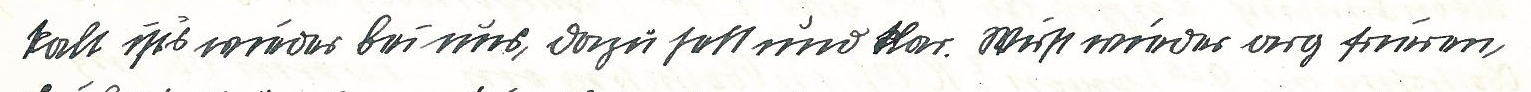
kalt ist’s wieder bei uns, dazu hell und klar. Wirst wieder arg frieren,
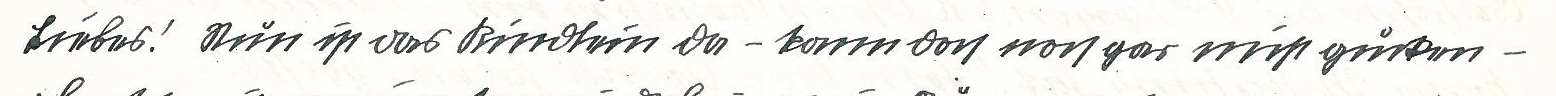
Liebes! Nun ist das Kindlein da – kann doch noch gar nicht gucken –
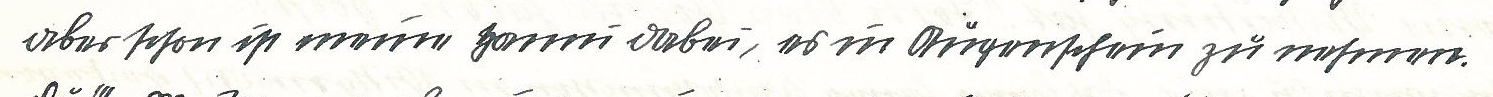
aber schon ist meine dabei, es in Augenschein zu nehmen.
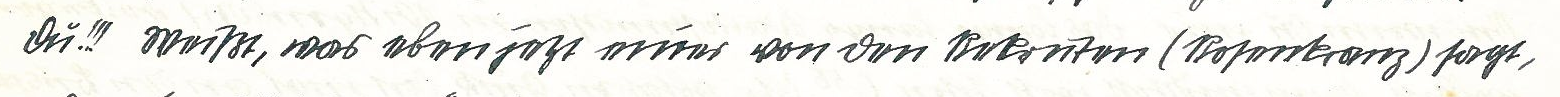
Du!!! Weißt, was eben jetzt einer von den Rekruten (R.) sagt,
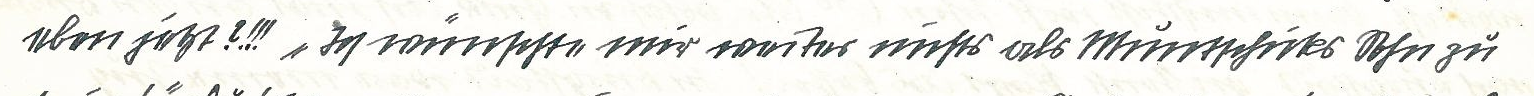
eben jetzt?!!! „Ich wünschte mir weiter nichts als Sohn zu
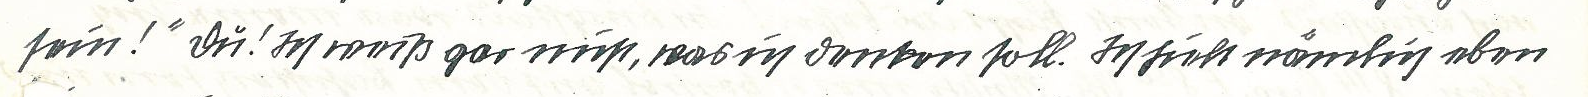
sein!” Du! Ich weiß gar nicht, was ich denken soll. Ich hielt nämlich eben
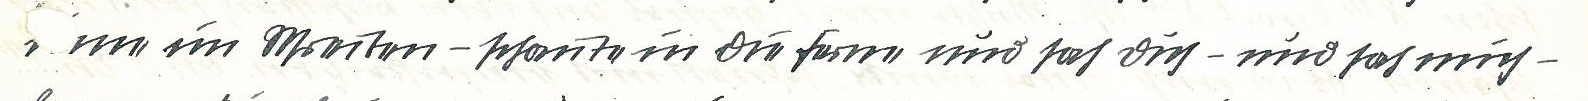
ne im Schreiben – schaute in die Ferne und sah Dich – und sah mich –
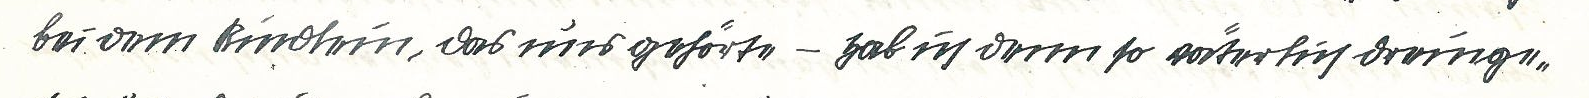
bei dem Kindlein, das uns gehörte – hab ich denn so väterlich dreinge¬
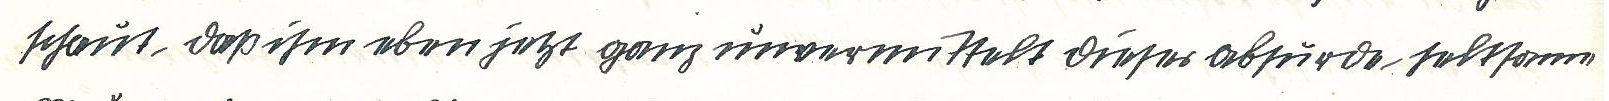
schaut, daß ihm eben jetzt ganz unvermittelt dieser absurde, seltsame
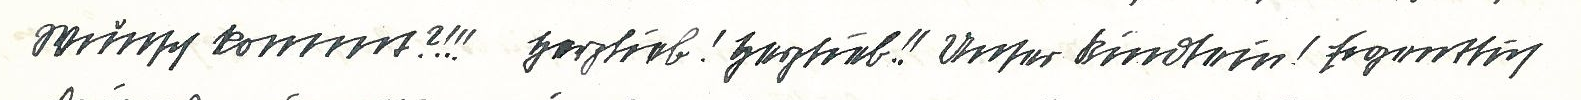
Wunsch kommt?!!! Herzlieb! Herzlieb!! Unser Kindlein! Eigentlich
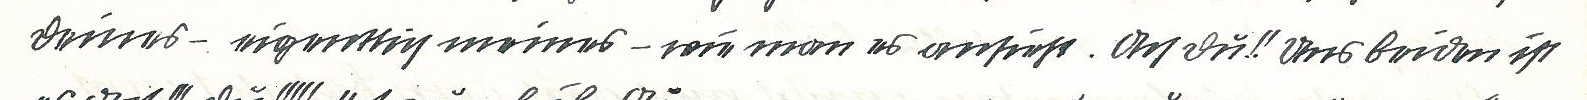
Deines – eigentlich meines – wie man es ansieht. Ach Du! Uns beiden ist
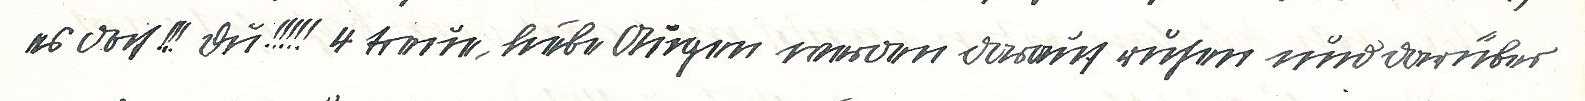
es doch!!! Du!!!!! 4 treue, liebe Augen werden darauf ruhen und darüber
